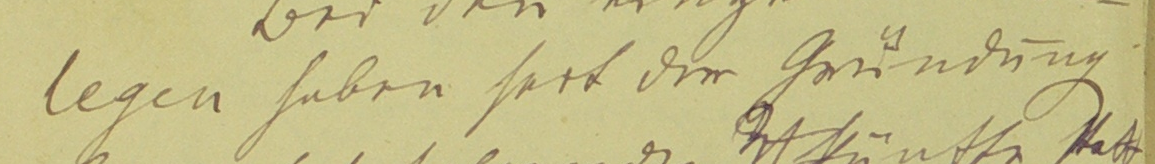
legen haben seit der Gründung
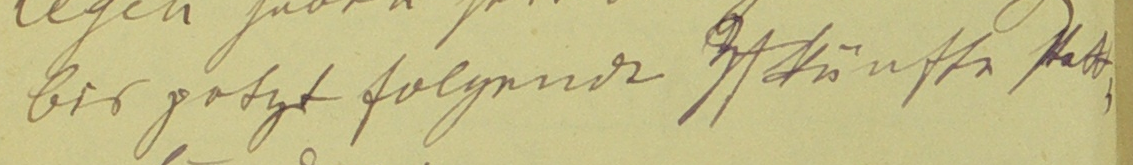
bis jetzt folgende Zusammenkünfte statt¬
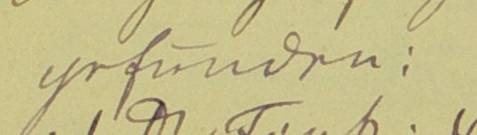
gefunden:
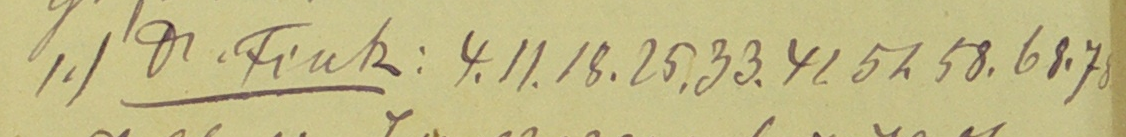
1.) Dr. Fink: 4.11.18.25.33.42.54.58.68.78
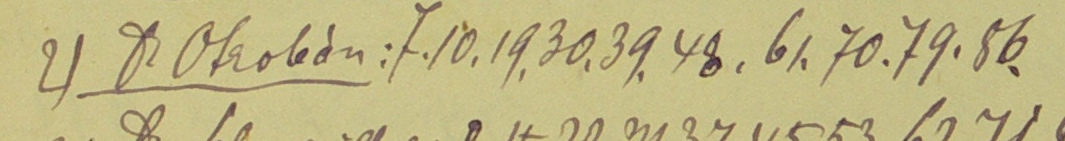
2.) Dr.Otroban: 7.10.19.30.39.48.61.70.79.86
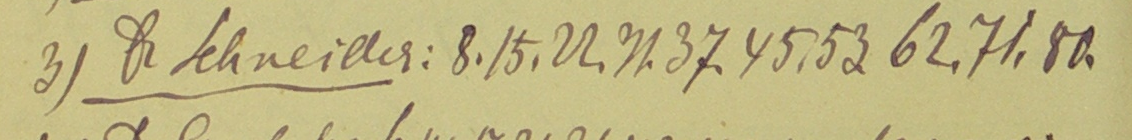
3.) Dr. Schneiller: 8.15.22.31.37.45.53.62.71.80.
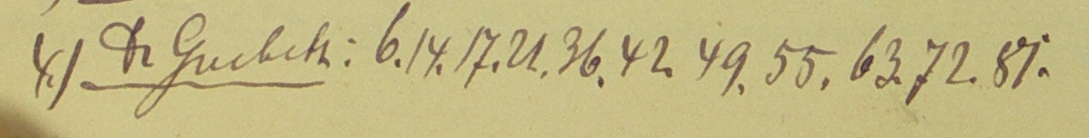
4.) Dr. Gusbeth: 6.14.17.21.36.42.49.55.63.72.81.
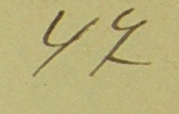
47
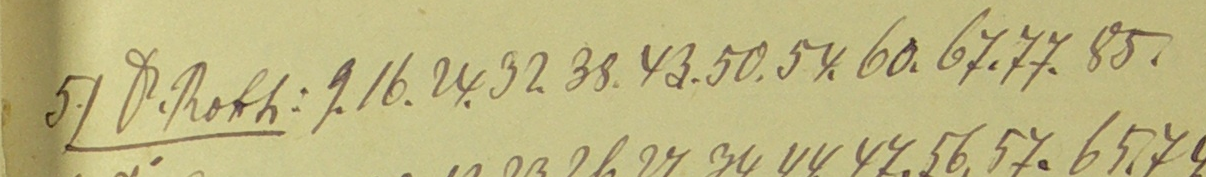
5.) Dr. Roth: 9.16.24.32.38.43.50.54.60.67.77.85.
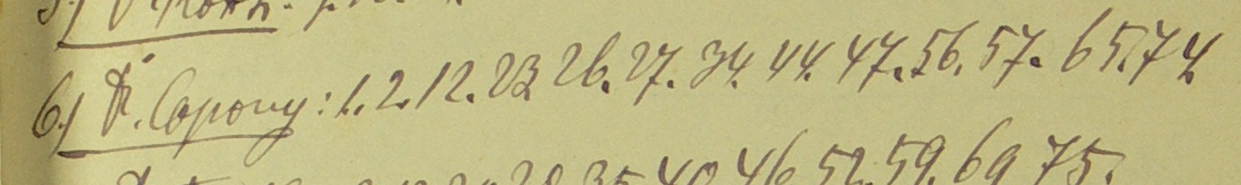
6.) Dr. Copony: 1.2.12.23.26.27.34.44.47.56.57.65.74.
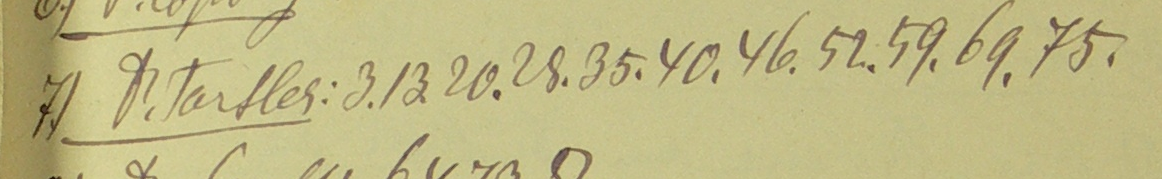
7.) Dr. Tartler: 3.13.20.28.35.40.46.52.59.69.75.
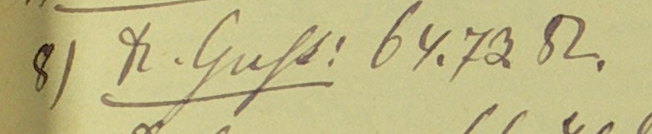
8.) Dr. Gust: 64.73.82.
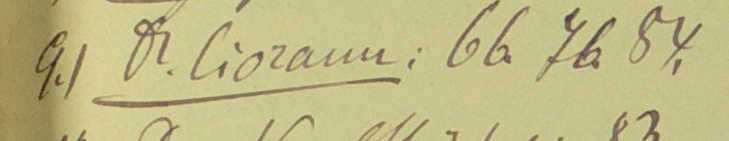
9.) Dr.Ciorann: 66.76.84.
